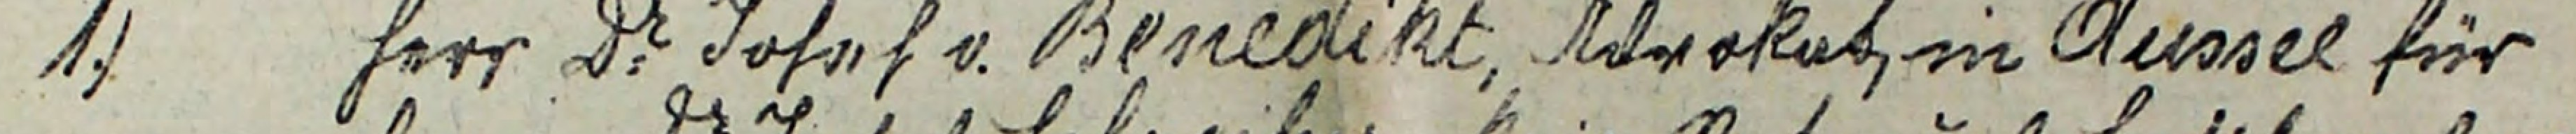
1.) Herr Dr Josef v. Benedikt, Advokat, in Aussee für
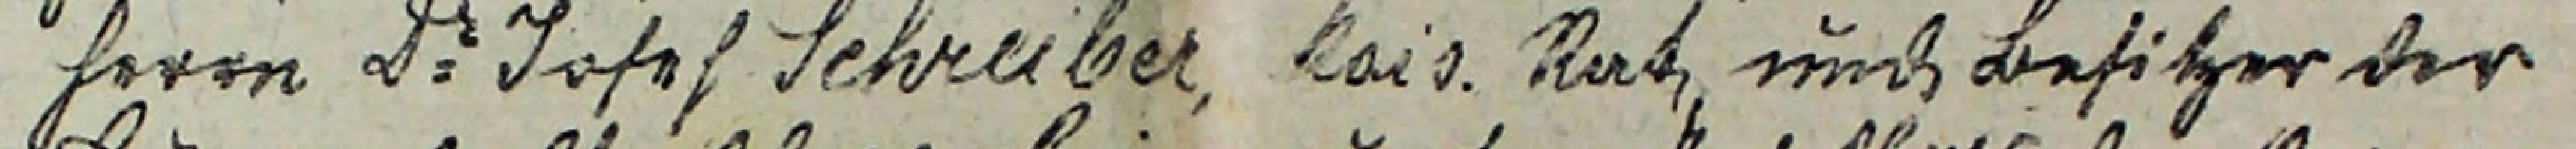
Herrn Dr Josef Schreiber, kais. Rat, und Besitzer der
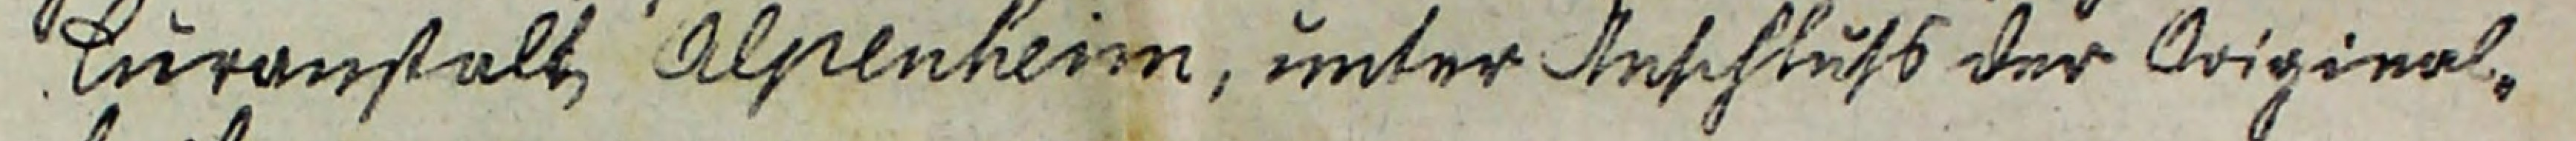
Curanstalt, Alpenheim, unter Anschluss der Original„
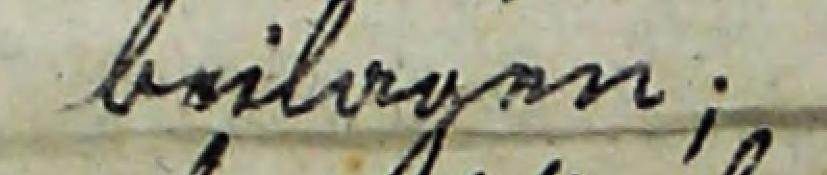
beilagen;
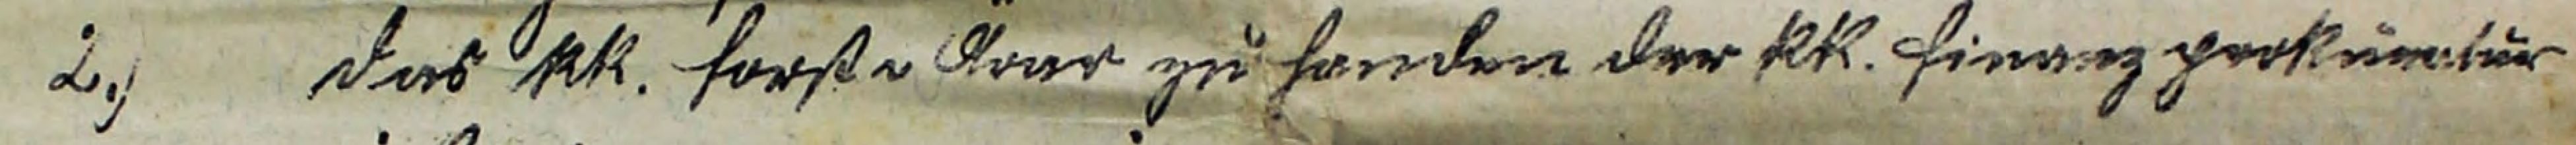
2.) Das kk. forste Ärar zu Handen der kk. Finanz prok???tur
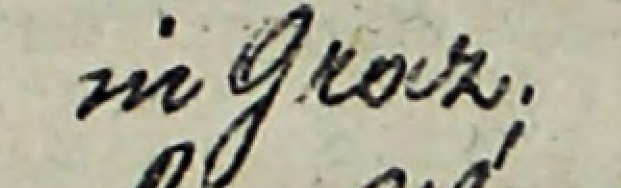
in Graz.
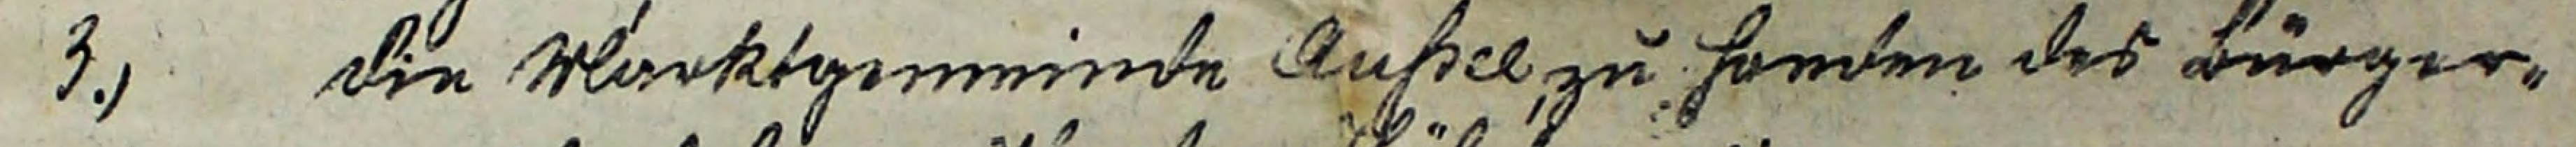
3.) Die Marktgemeinde Aussee, zu Handen des Bürger„
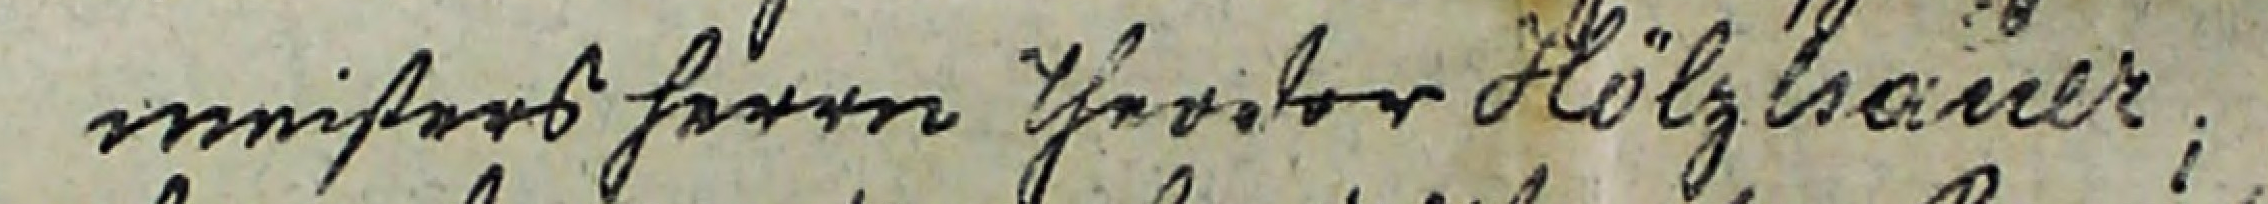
meisters Herrn Theodor Hölzhauer;
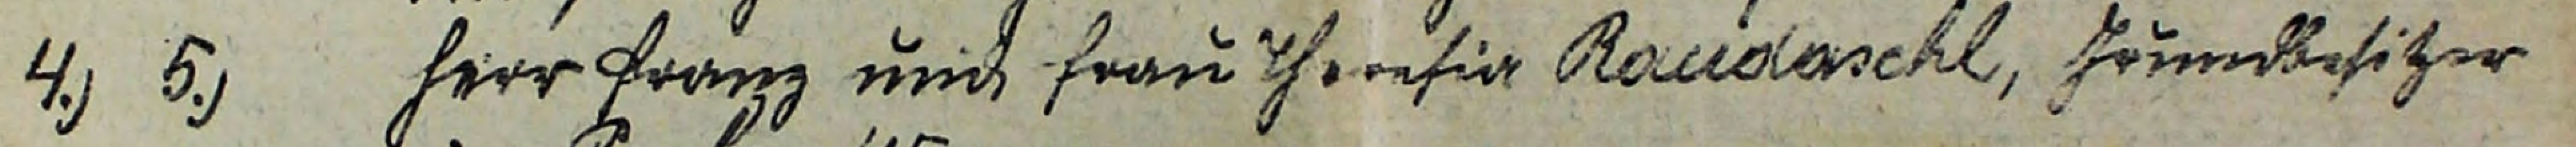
4.) 5.) Herr Franz und Frau Theresia Raudaschl, Grundbesitzer
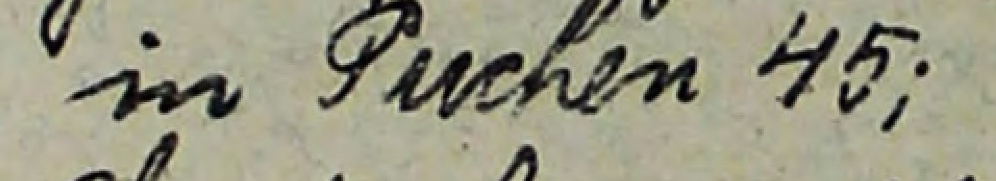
in Puchen 45;
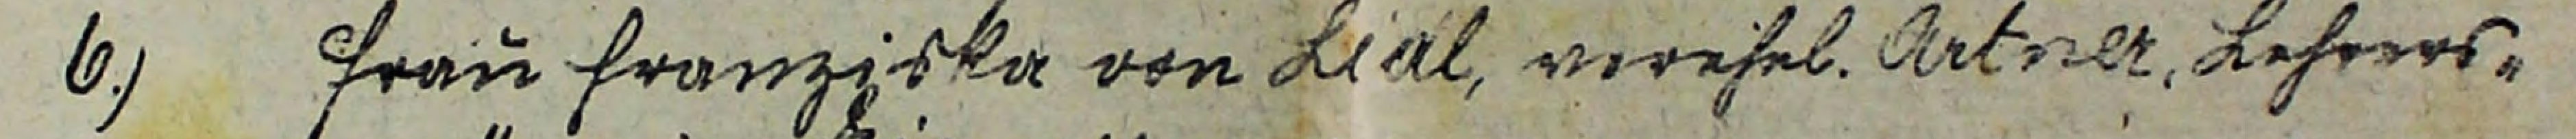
6.) Frau Franziska von Lial, verehel. Artner, Lehrers„
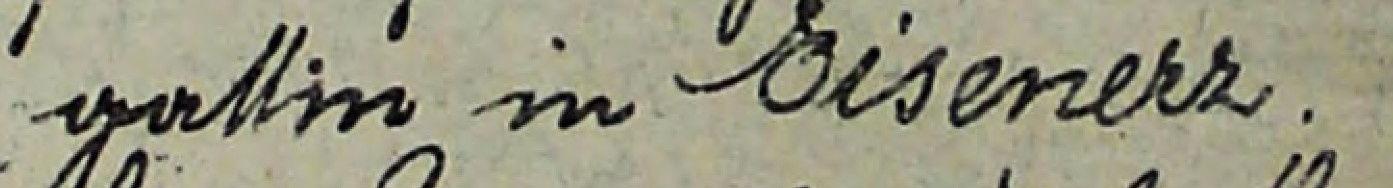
gattin in Eisenerz.
